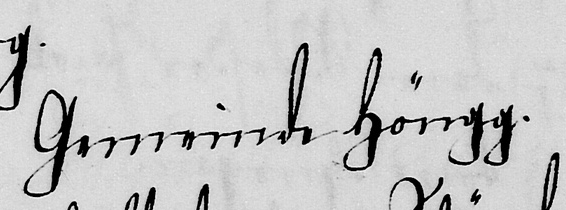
Gemeinde Höngg.
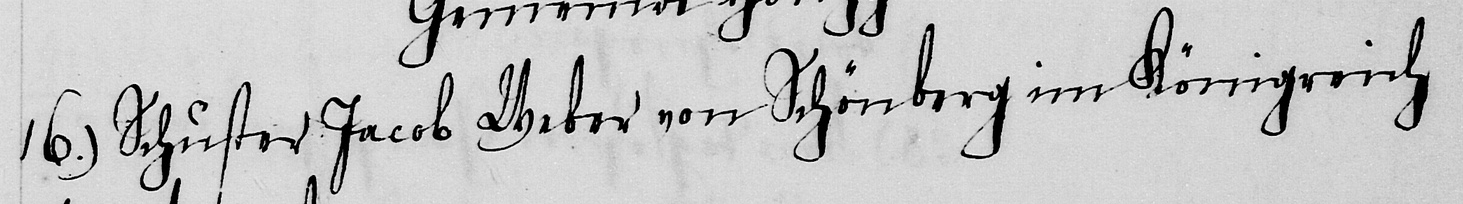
16.) Schuster Jacob Weber von Schönberg im Königreich
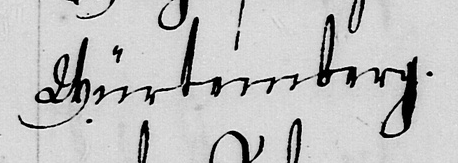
Würtemberg.
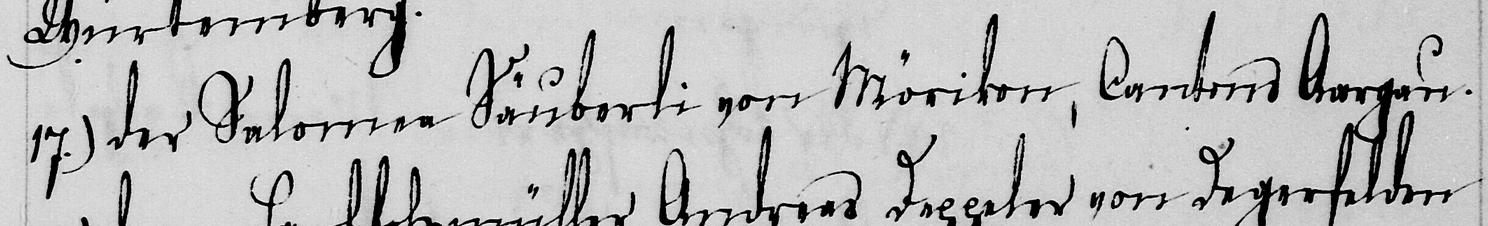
17.) der Salomea Säuberli von Mörikon, Cantons Aargau.
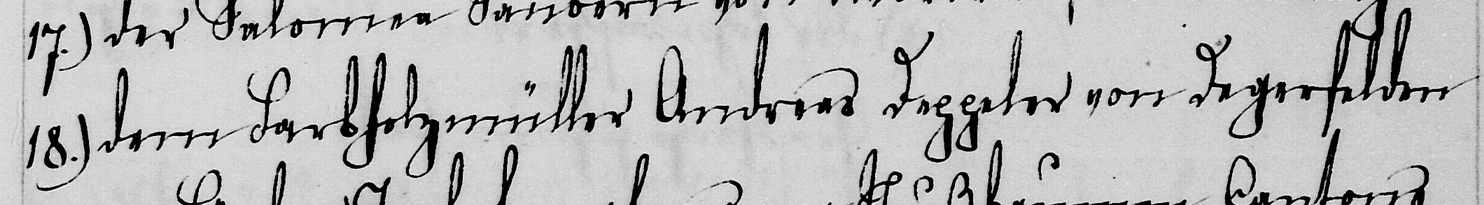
18.) dem Farbholzmüller Andreas Deppeler von Degerfelden
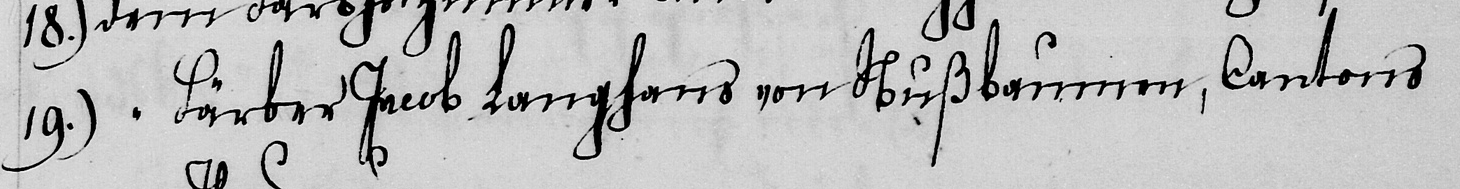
19.) “ Färber Jacob Langhans von Nußbaumen, Cantons
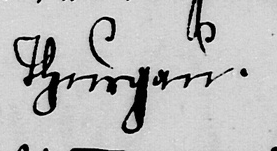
Thurgau.
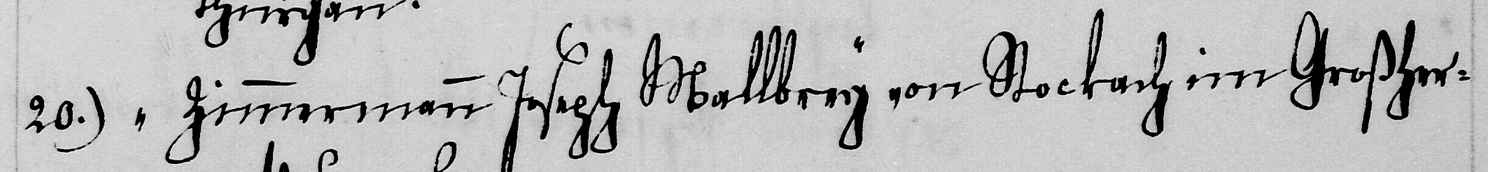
20.) “ Zimmermann Joseph Mallbrey von Stockach im Großher¬
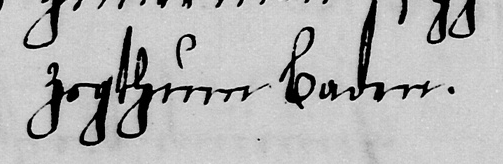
zogthum Baden.
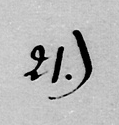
11.)
